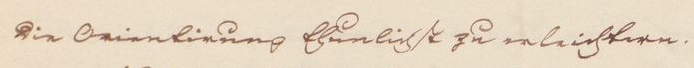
die Orientirung thunlichst zu erleichtern.
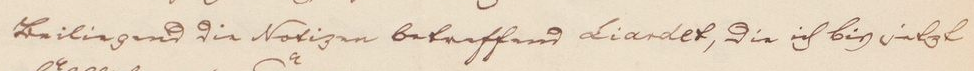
Beiliegend die Notizen betreffend Liardet, die ich bis jetzt
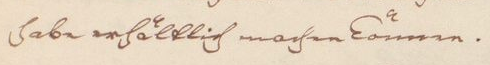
habe erhältlich machen können.
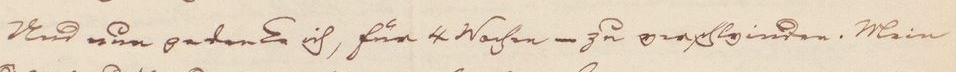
Und nun gedenke ich, für 4 Wochen – zu verschwinden. Mein
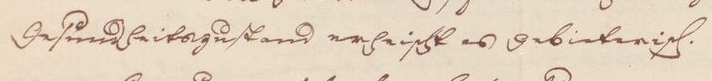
Gesundheitszustand erheischt es gebieterisch.
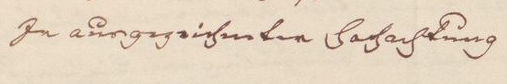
In ausgezeichneter Hochachtung
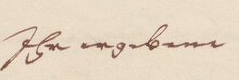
Ihr ergebene
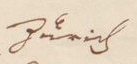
Zürich
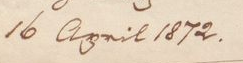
16. April 1872.
